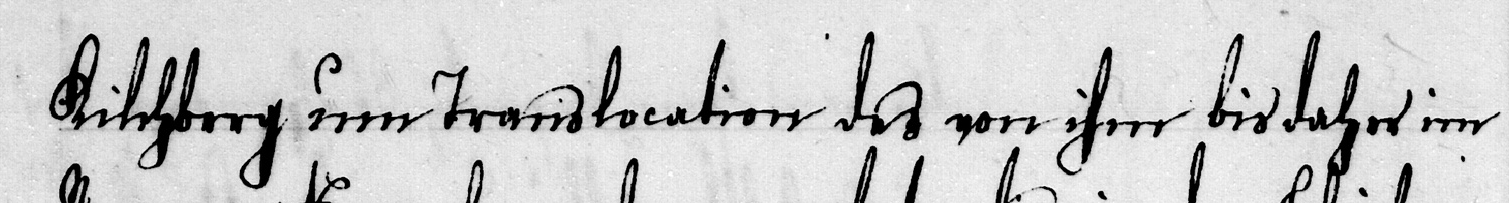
Kilchberg um Translocation des von ihm bis daher im
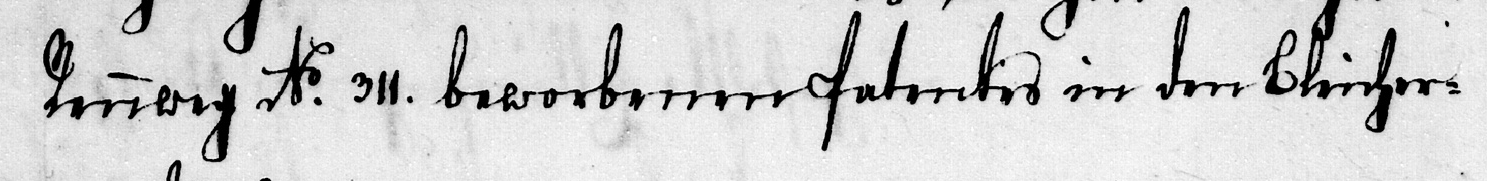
Rennweg No. 311. beworbenen Patentes in den Bleicher¬
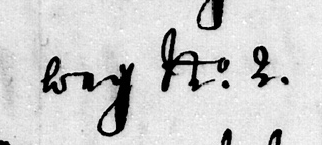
weg No. 2.
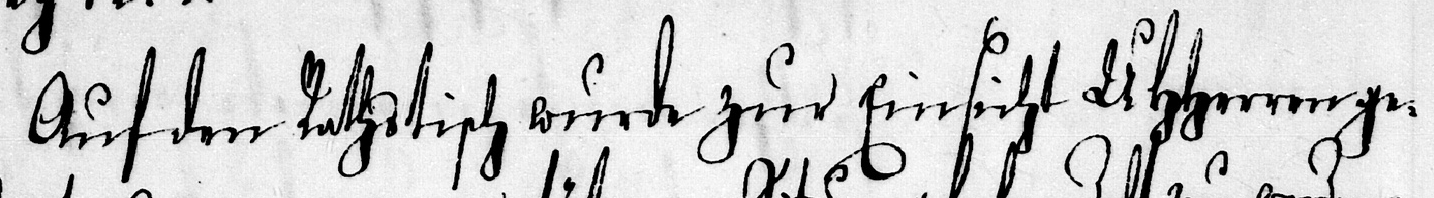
Auf den Rathstisch wurde zur Einsicht UHHerren ge¬
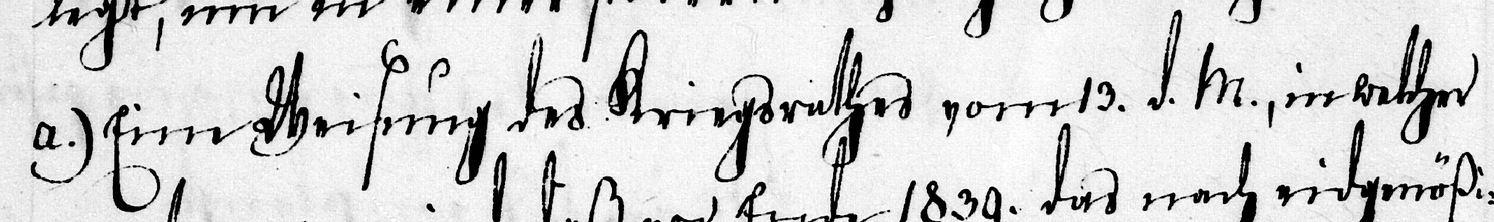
a.) Eine Weisung des Kriegsrathes vom 13. d. M., in welch¬
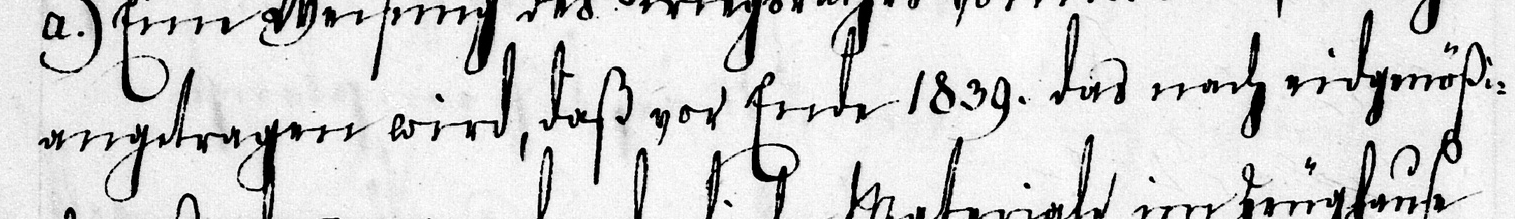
angetragen wird, daß vor Ende 1839. das nach eidgenößi¬
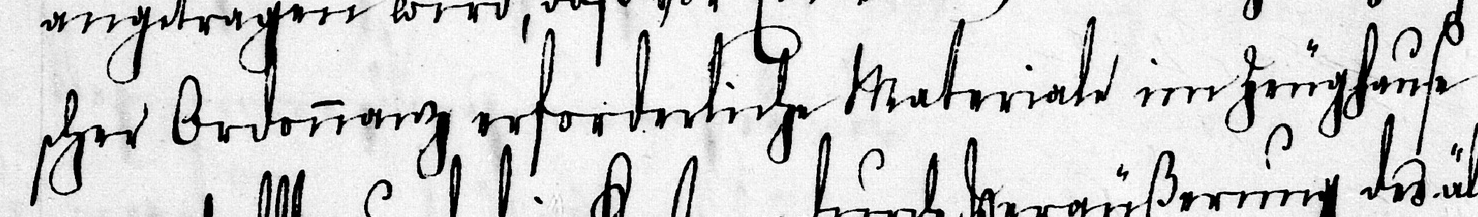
scher Ordonnanz erforderliche Materiale im Zeughause
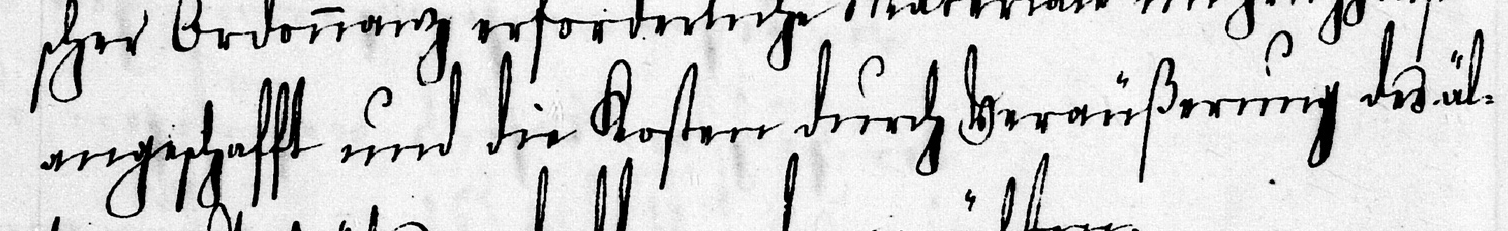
angeschafft und die Kosten durch Veräußerung des ä¬
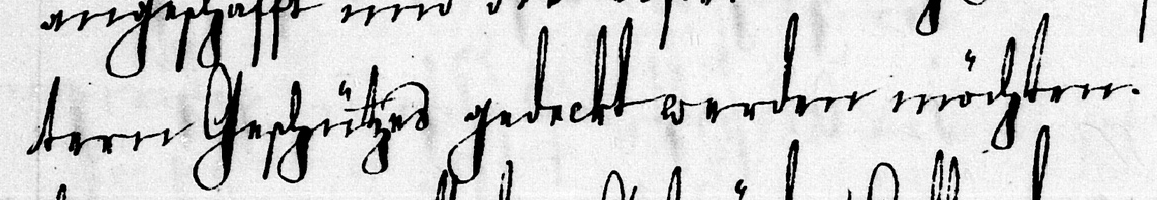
ltern Geschützes gedeckt werden möchten.
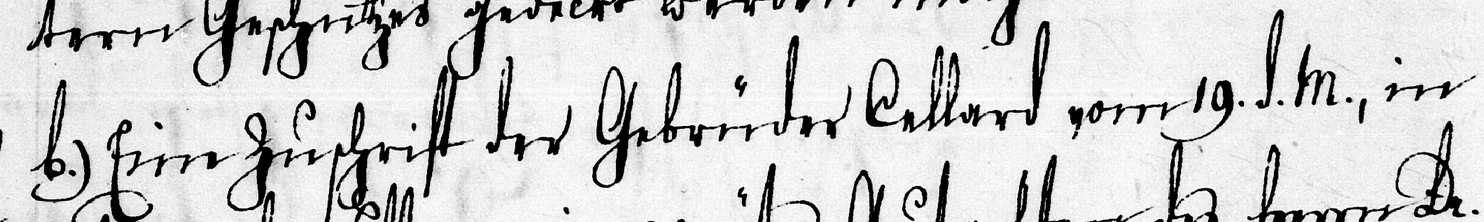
b.) Eine Zuschrift der Gebrüder Cellard vom 19. d. M., in
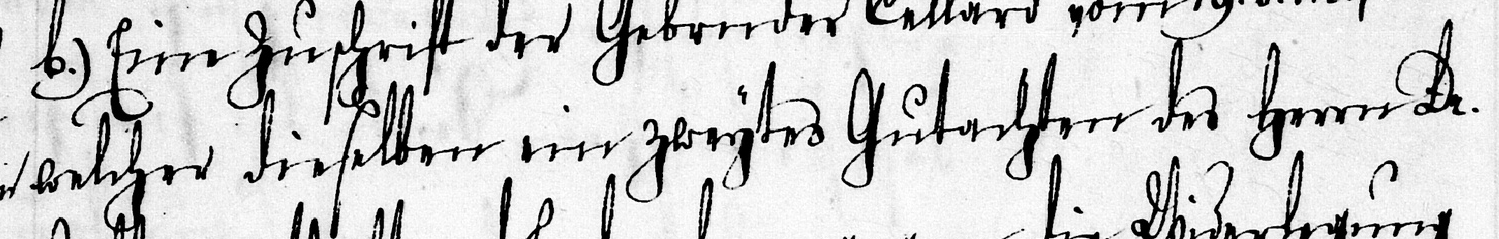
welcher dieselben ein zweytes Gutachten des Herrn Dr.
